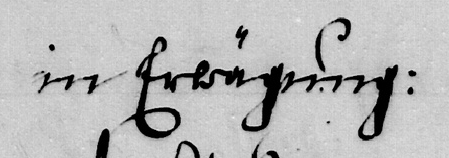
in Erwägung:
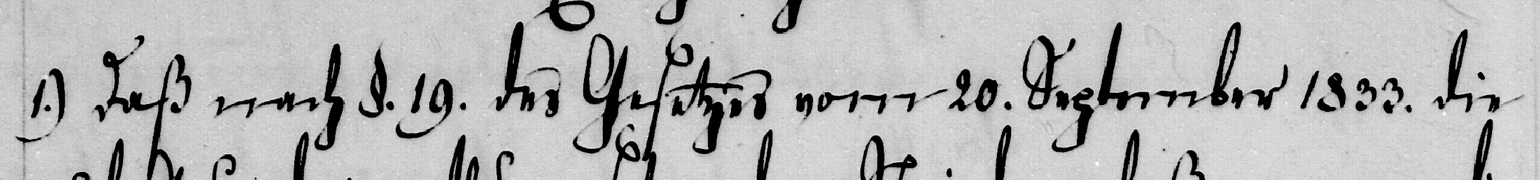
1.) Daß nach §. 19. des Gesetzes vom 20. September 1833. die
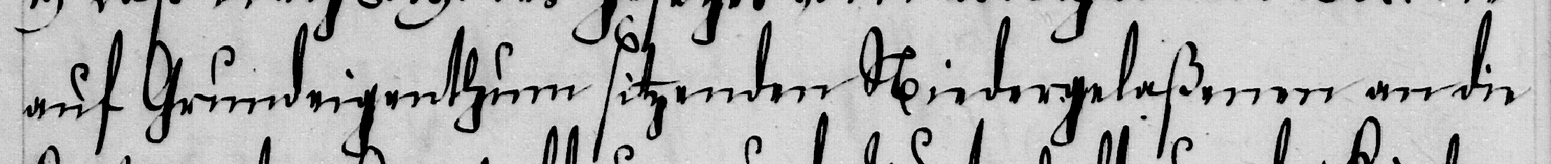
auf Grundeigenthum sitzenden Niedergelaßenen an die
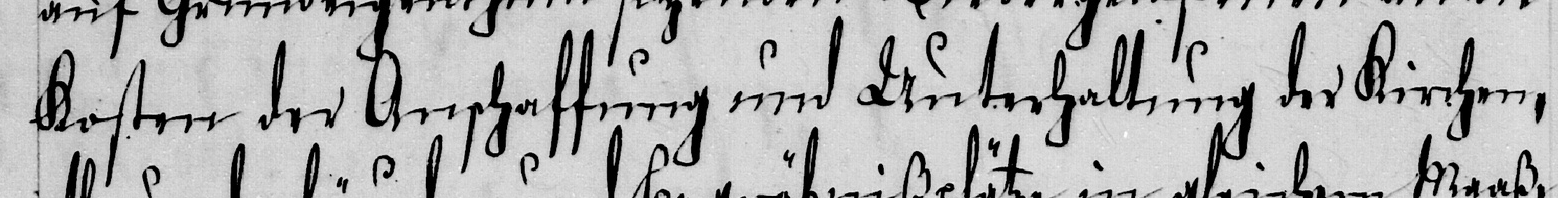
Kosten der Anschaffung und Unterhaltung der Kirchen,
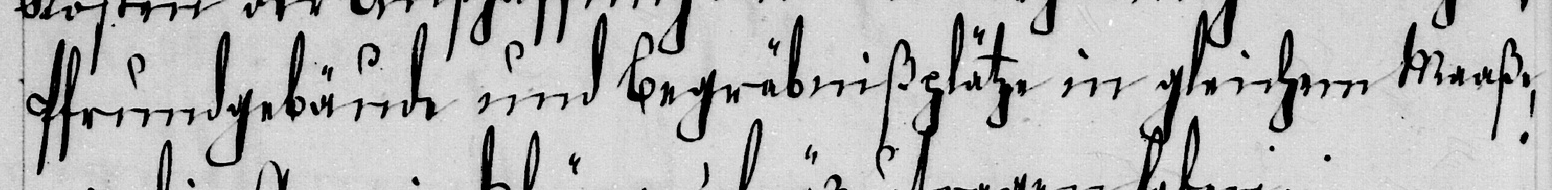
Pfrundgebäude und Begräbnißplätze in gleichem Maße,
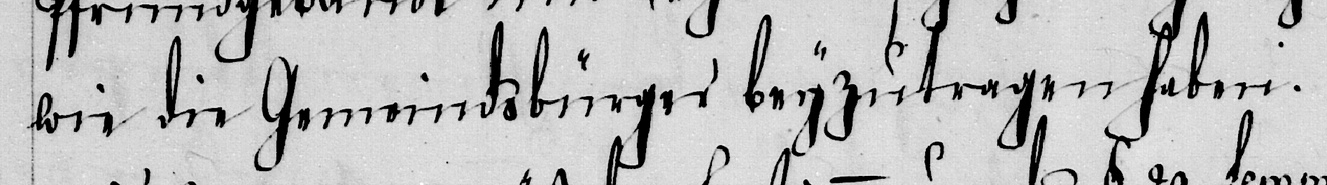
wie die Gemeindsbürger beyzutragen haben.
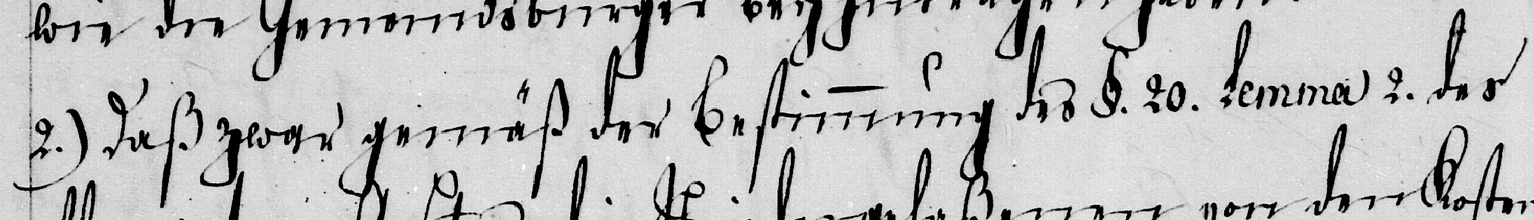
2.) Daß zwar gemäß der Bestimmung des §. 20. Lemma 2. des
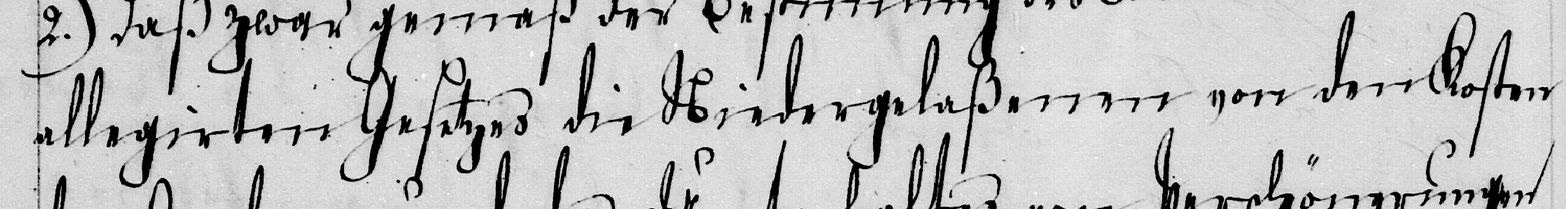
allegirten Gesetzes die Niedergelaßenen von den Kosten
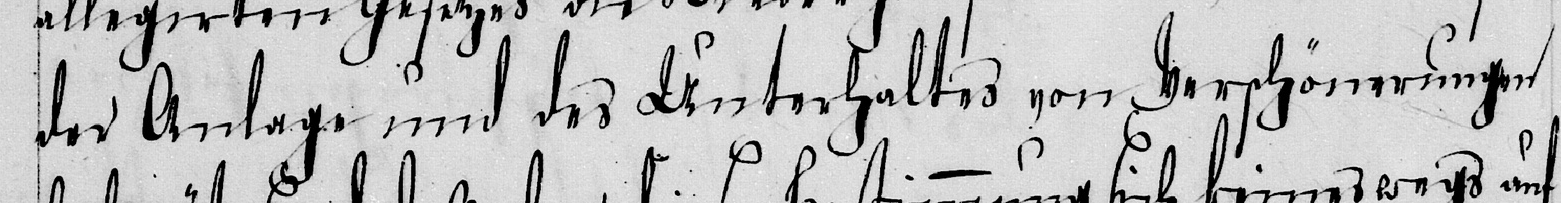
der Anlage und des Unterhalts von Verschönerungen
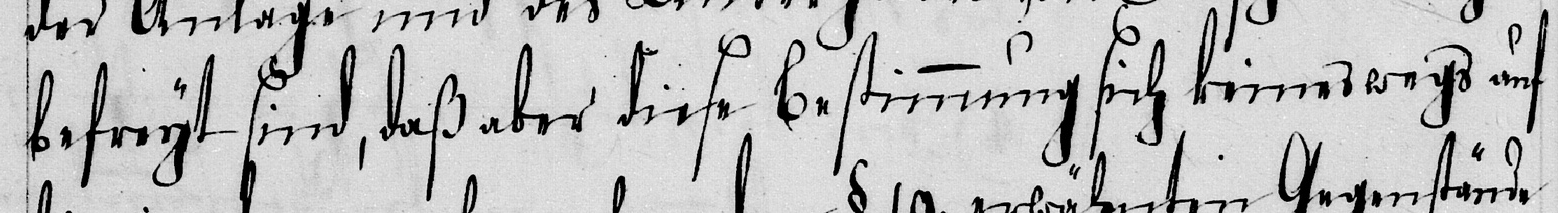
befreyt sind, daß aber diese Bestimmung sich keineswegs auf
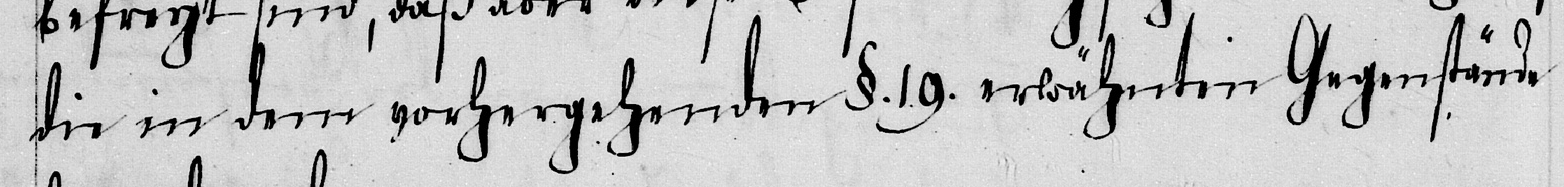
die in dem vorhergehenden §. 19. erwähnten Gegenstände
